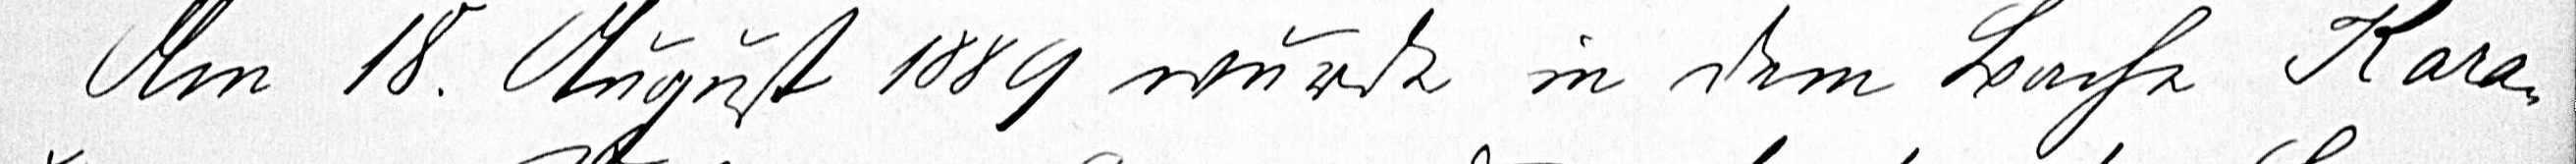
Am 18. August 1889 wurde in dem Lache Kara¬
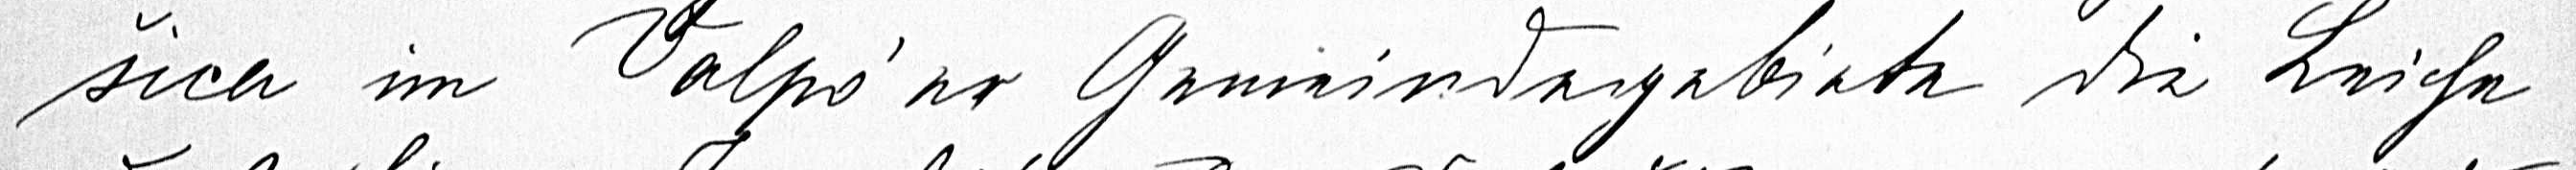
šich in in Valpo’er Gemeindegebiete die Leiche
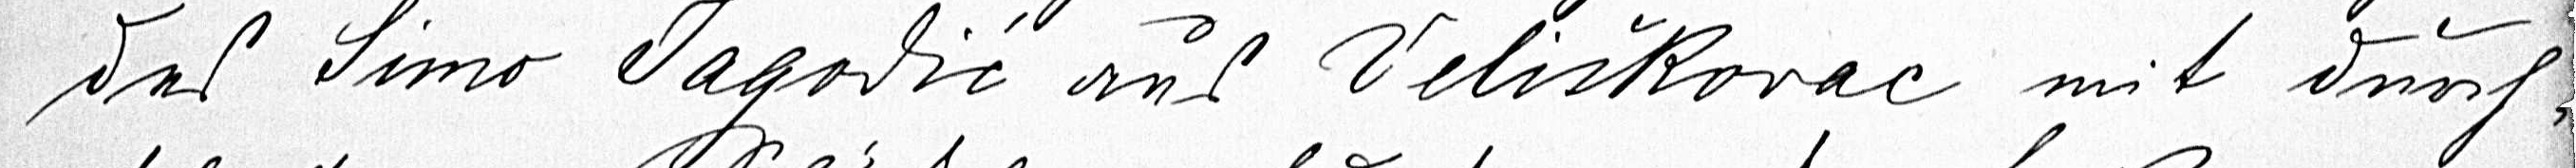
des Simo Jagodić aus Veliškovac mit durch¬
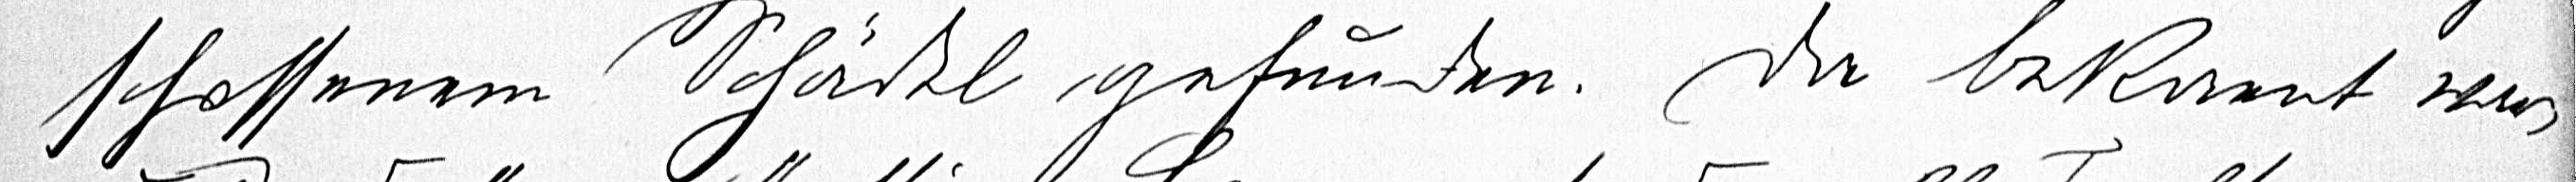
geschossenem Schädl gefunden. Da bekannt war,
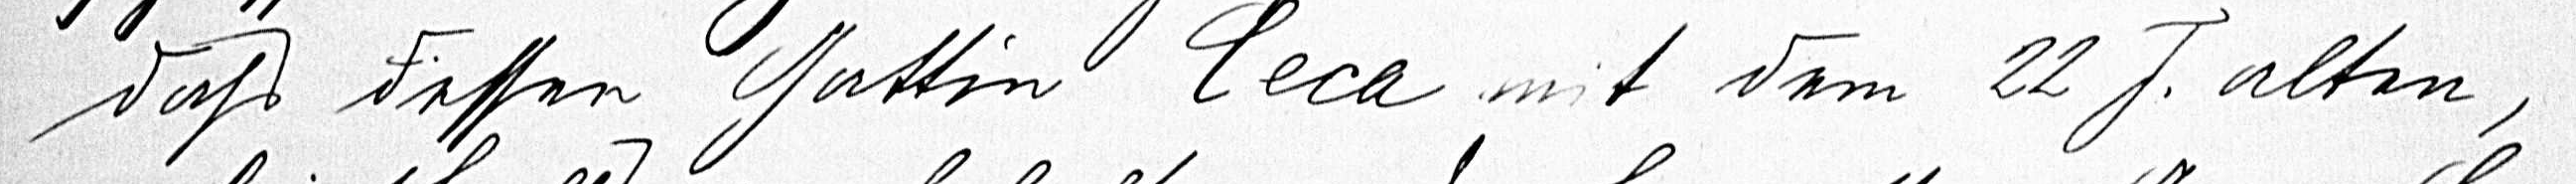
daß dessen Gattin Ceca mit dem 22 J. alten,
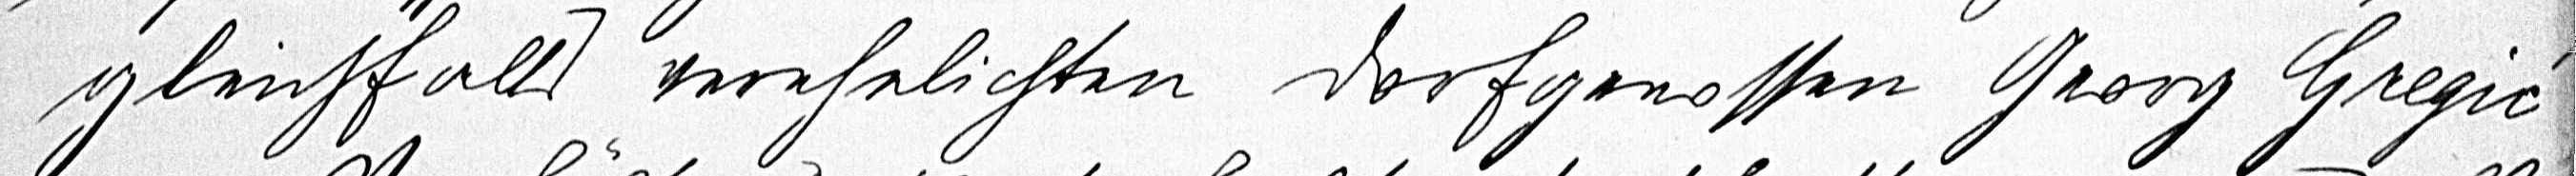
gleichfalls verehelichten Dorfgenossen Georg Gregić
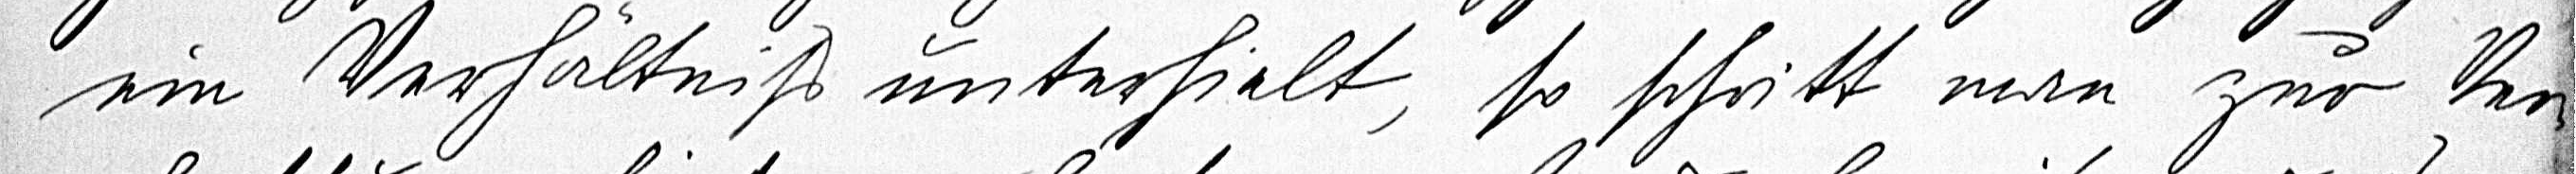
im Verhältniß unterhielt, so schritt man zur Ver¬
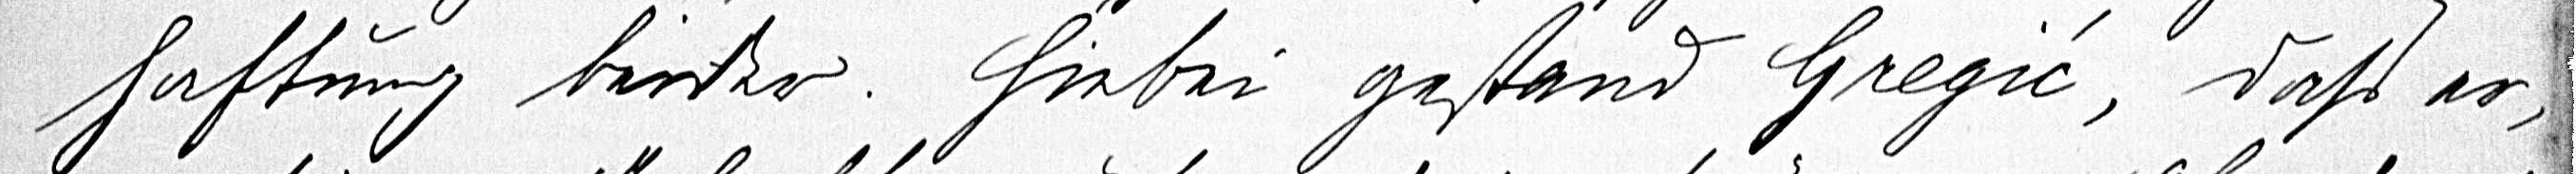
haftung beider. Hiebei gestand Gregić, daß er,
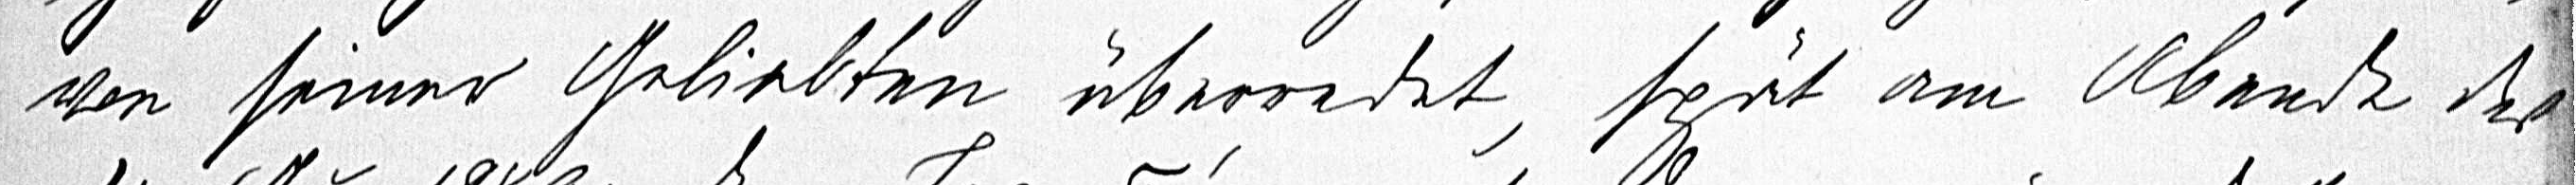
von seiner Geliebten überredet, spät am Abende des
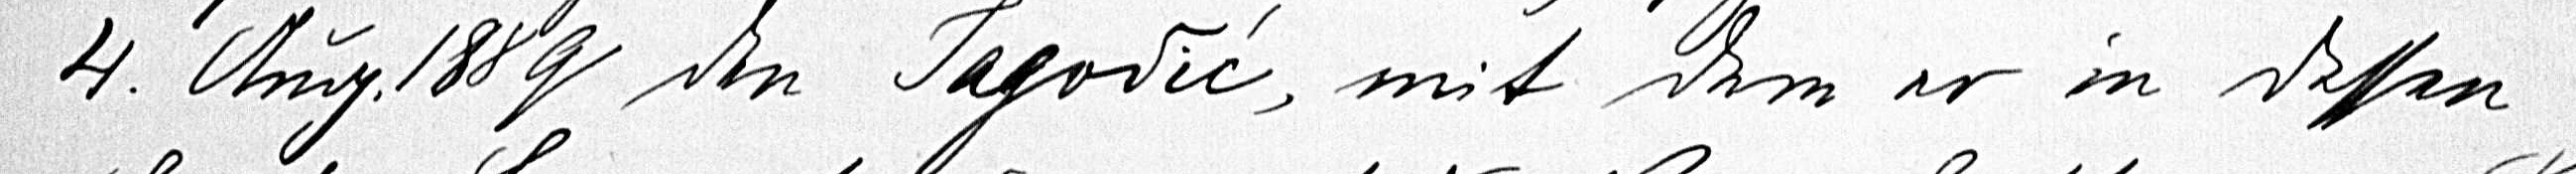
4. Aug. 1889 den Jagodić, mit dem er in dessen
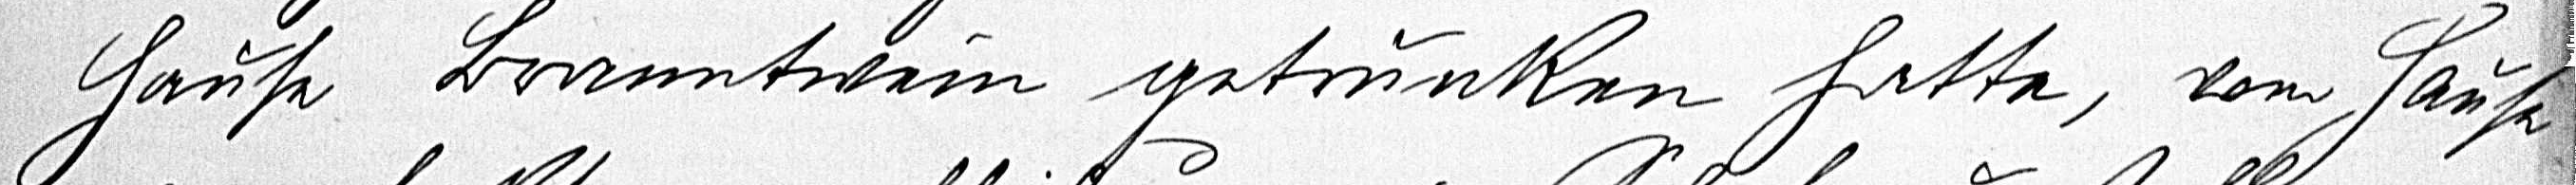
Hause Branntwein getrunken hatte, vom Hause
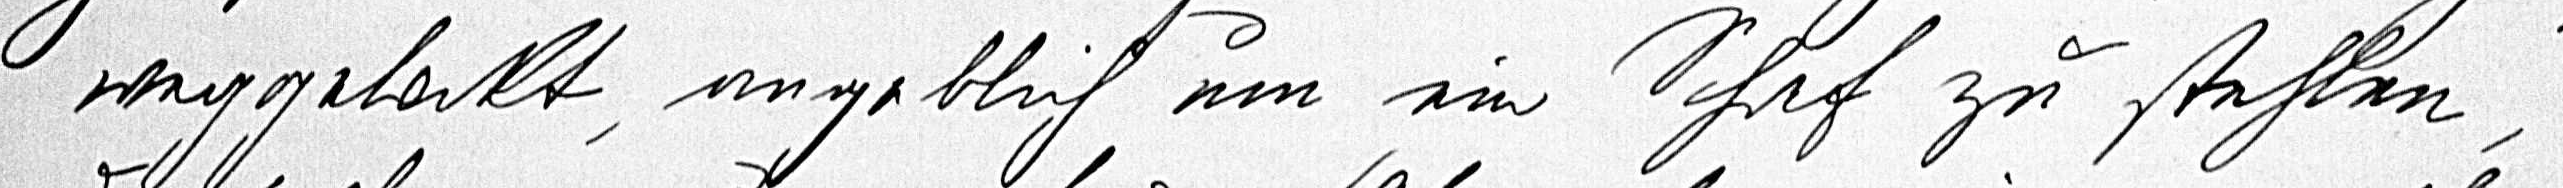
weggelockt, angeblich um ein Schaf zu stehlen,
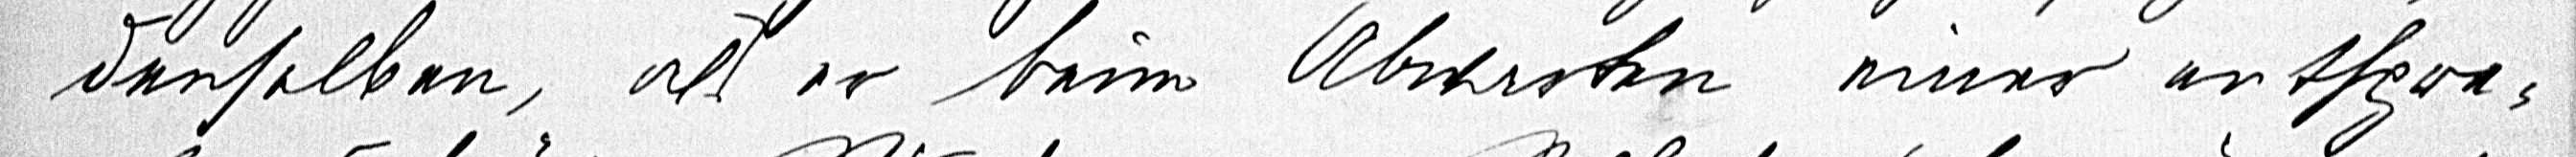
denselben als er beim Abwarten eines entspre¬
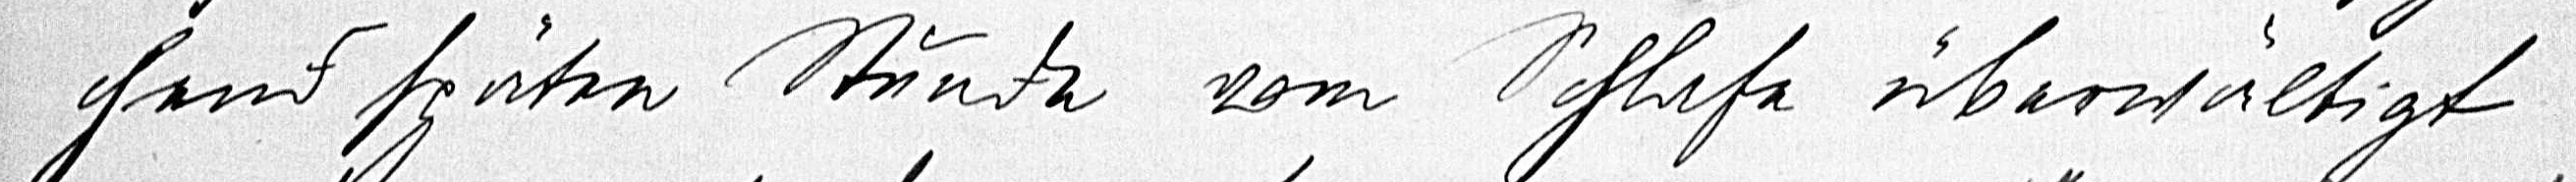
chend späten Stunde vom Schlafe überwältigt
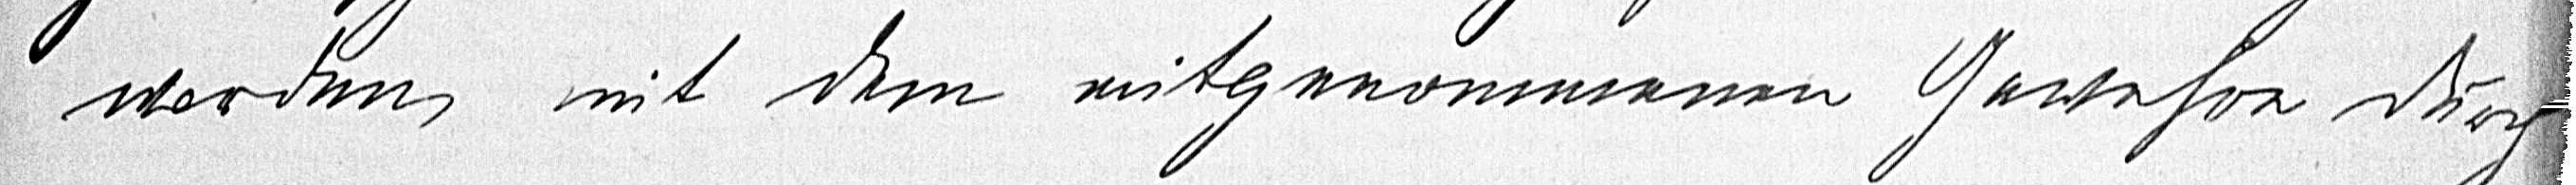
werden, mit dem mitgenommenen Gewehr durch
